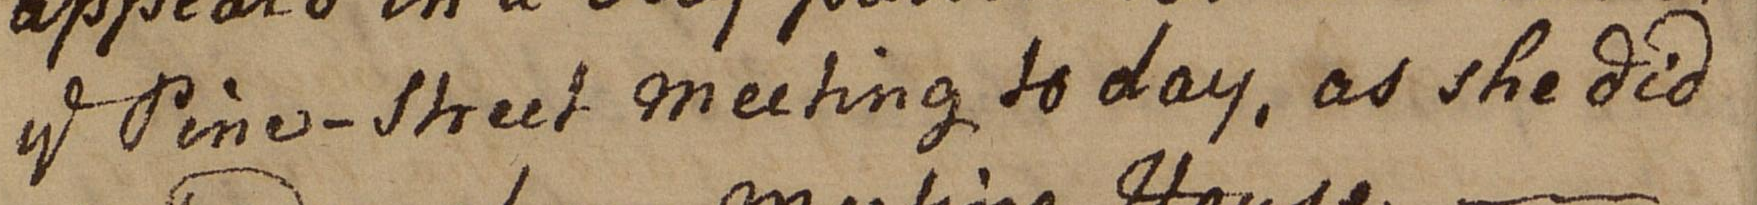y^e Pine- Street meeting today, as she did
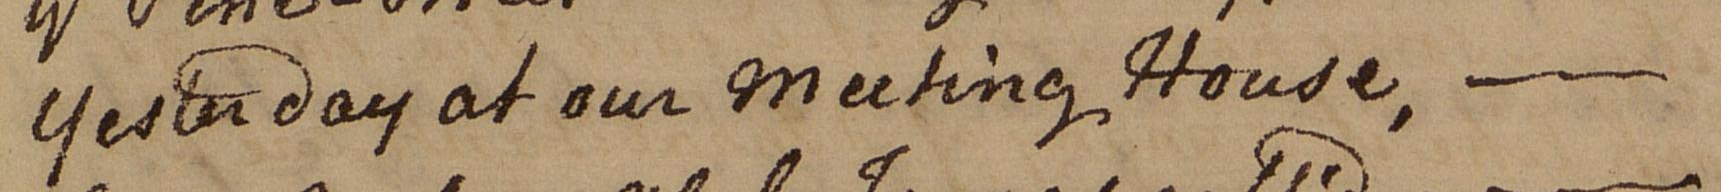Yesterday at our meeting House,-
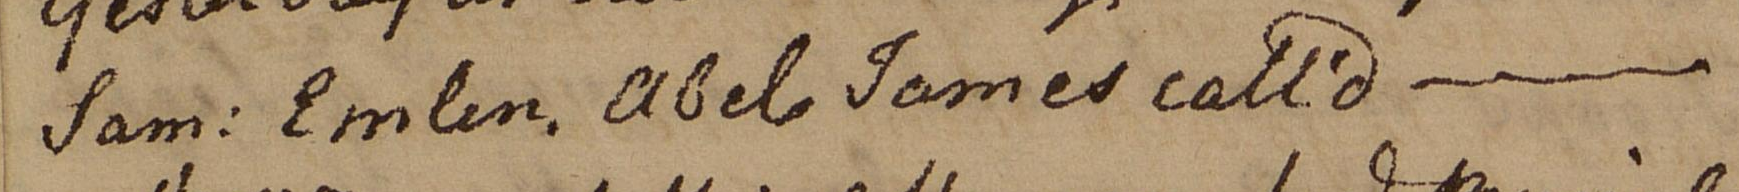Sam: Emlen. Abel James call'd-
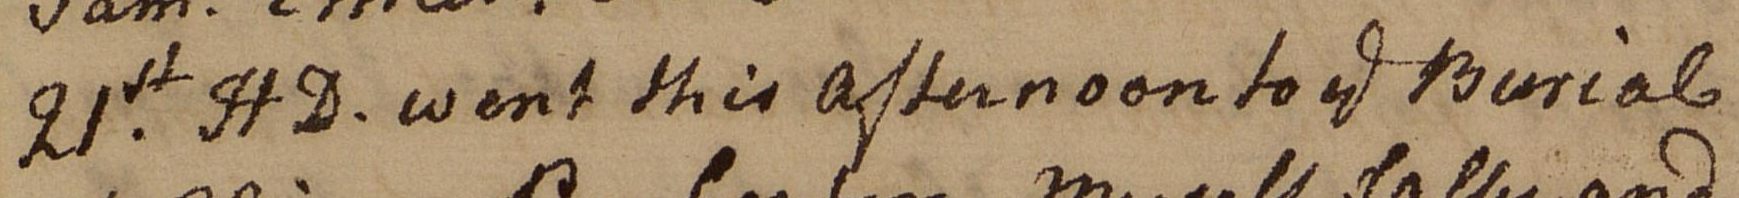21^st. HD went this afternoon to y^e Burial
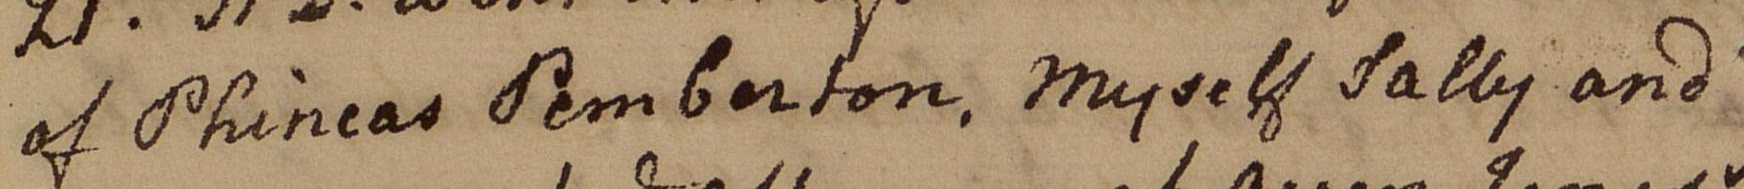of Phineas Pemberton, Myself Sally and
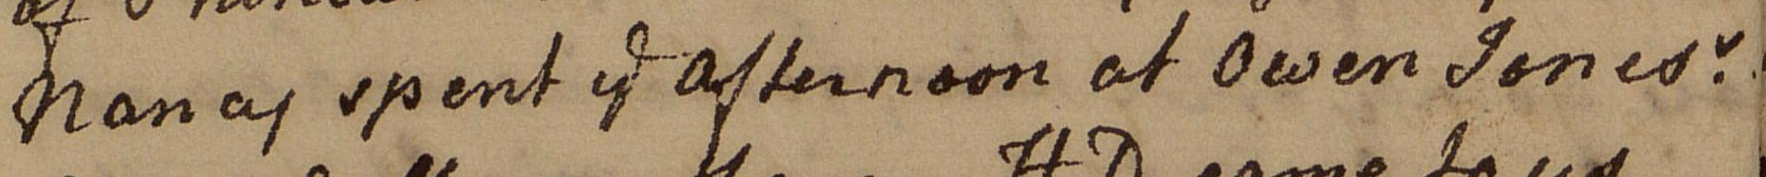Nancy spent y^e afternoon at Owen Jones^s.
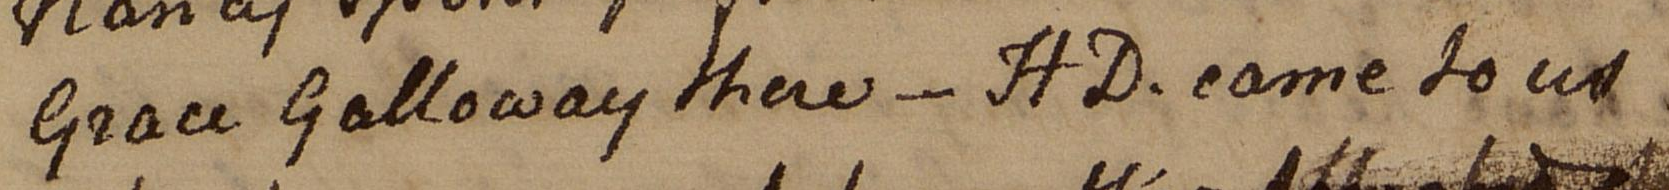Grace Galloway there- H D. came to us
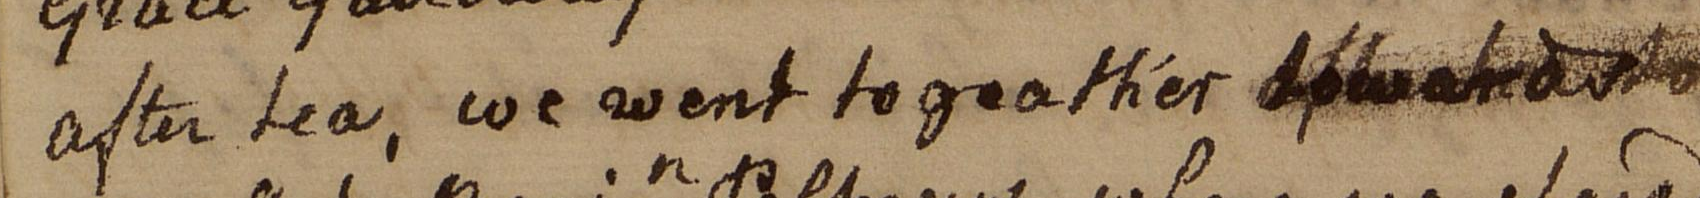after tea, we went togeather towards
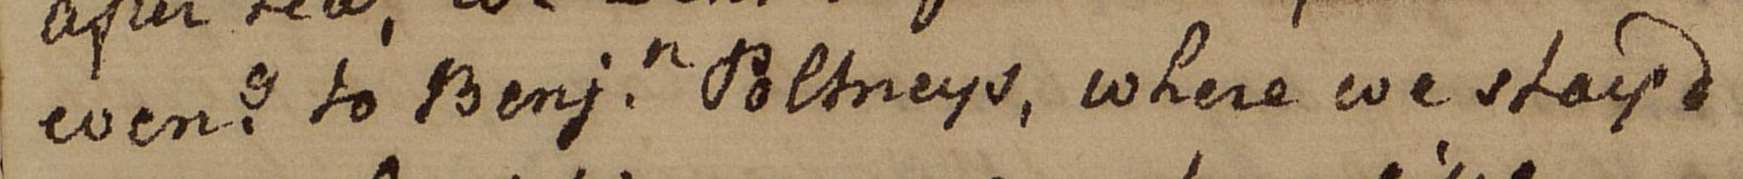even^g. to Benj^n. Poltneys, where we stay'd
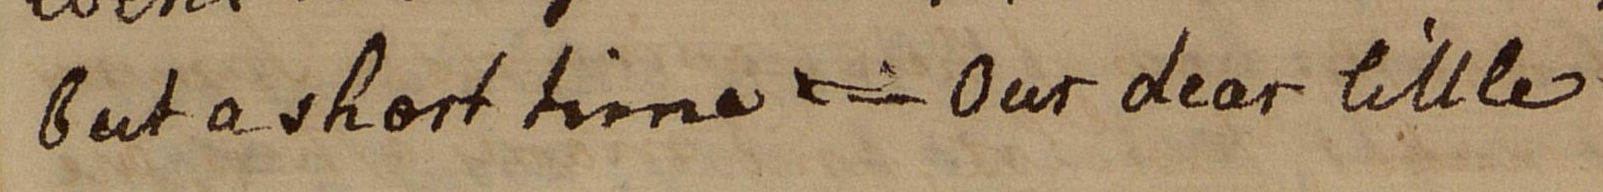but a short time-- Our dear little
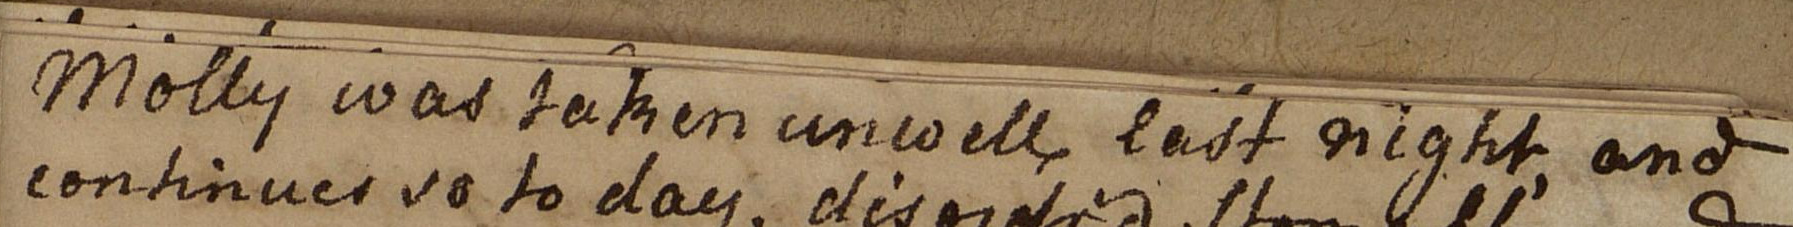Molly was taken unwell last night, and
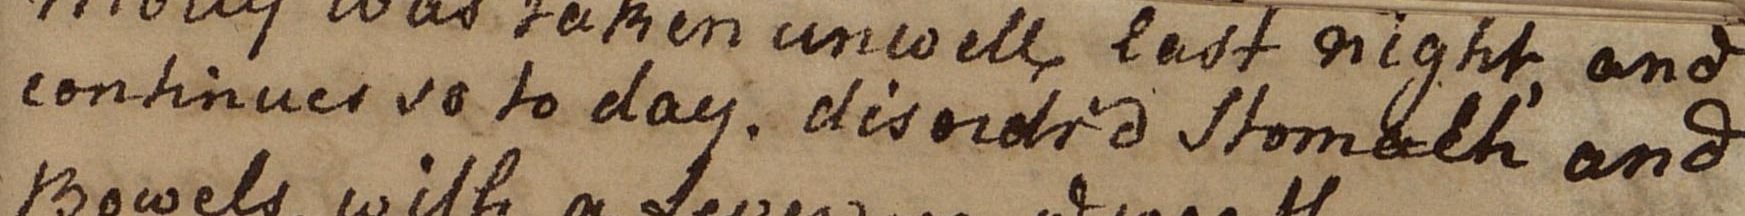continues so to day, disordr'd Stomach and
